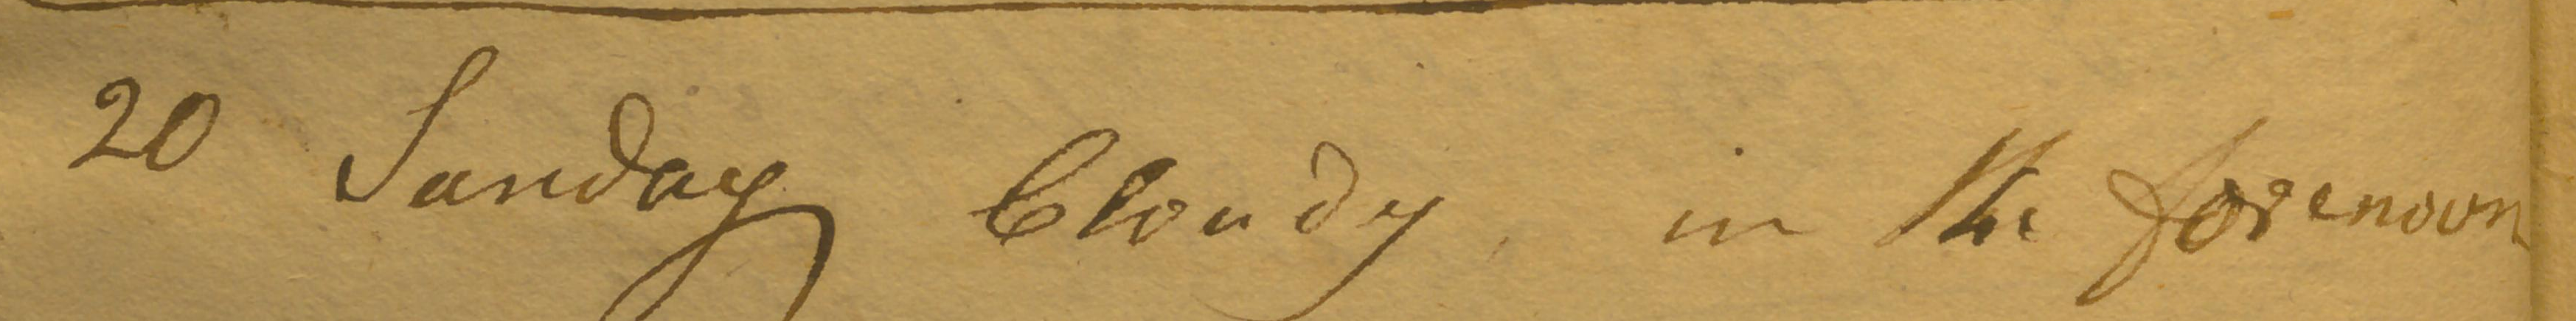20 Sunday Cloudy in the forenoon
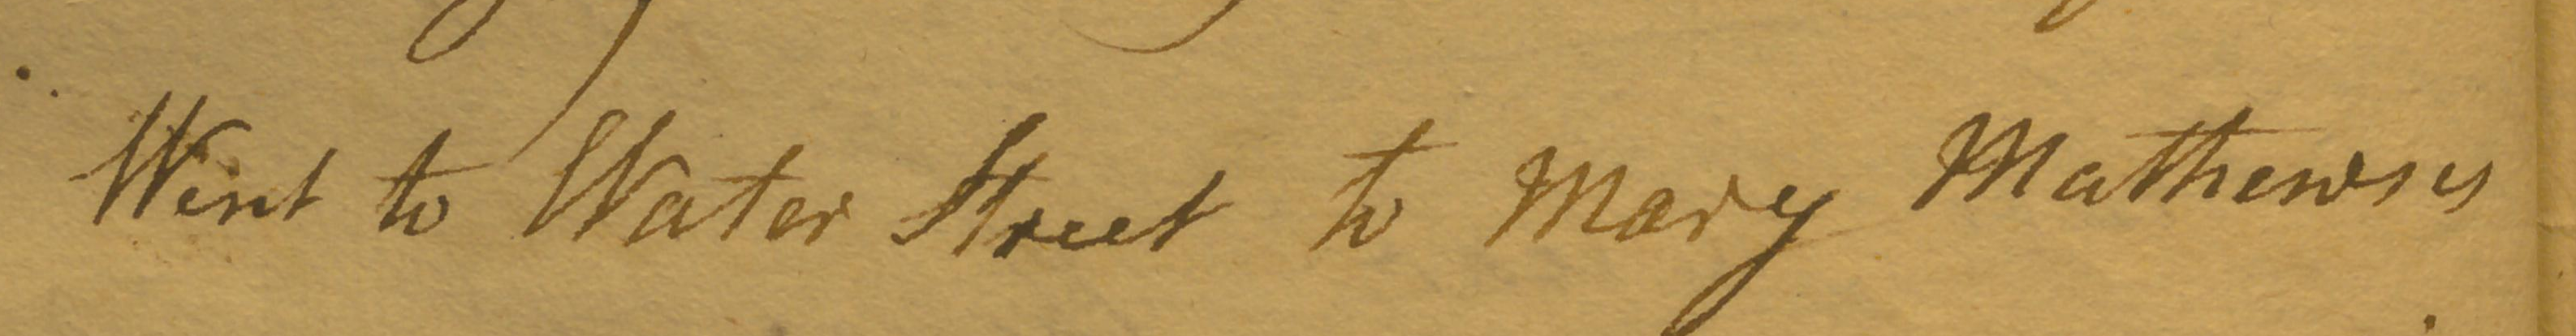Went to Water Street to Mary Mathewses
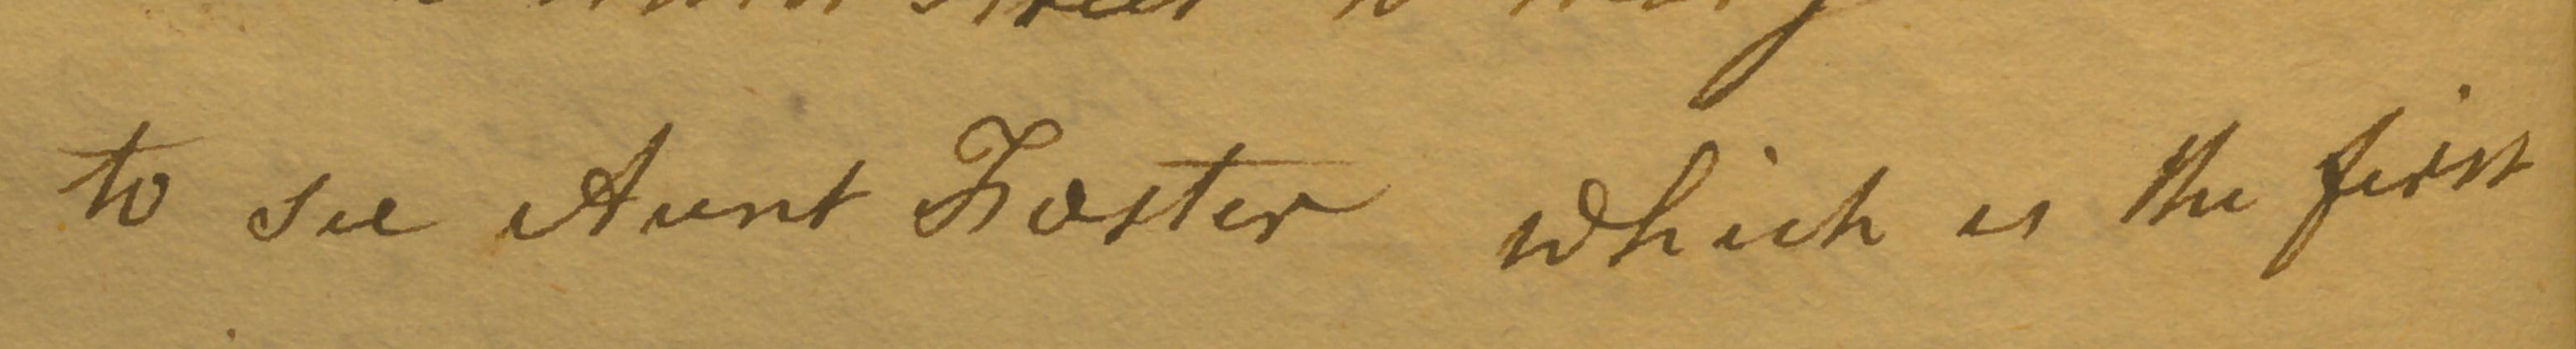to see Aunt Foster which is the first
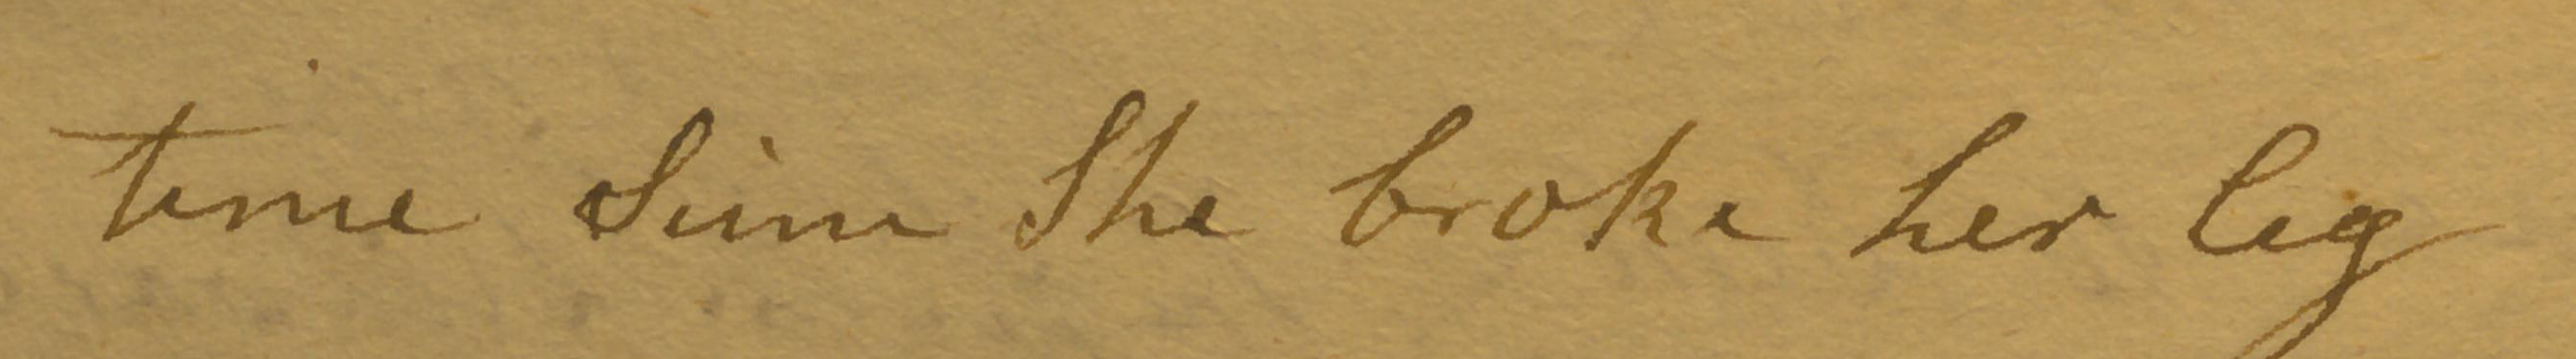time since she broke her leg
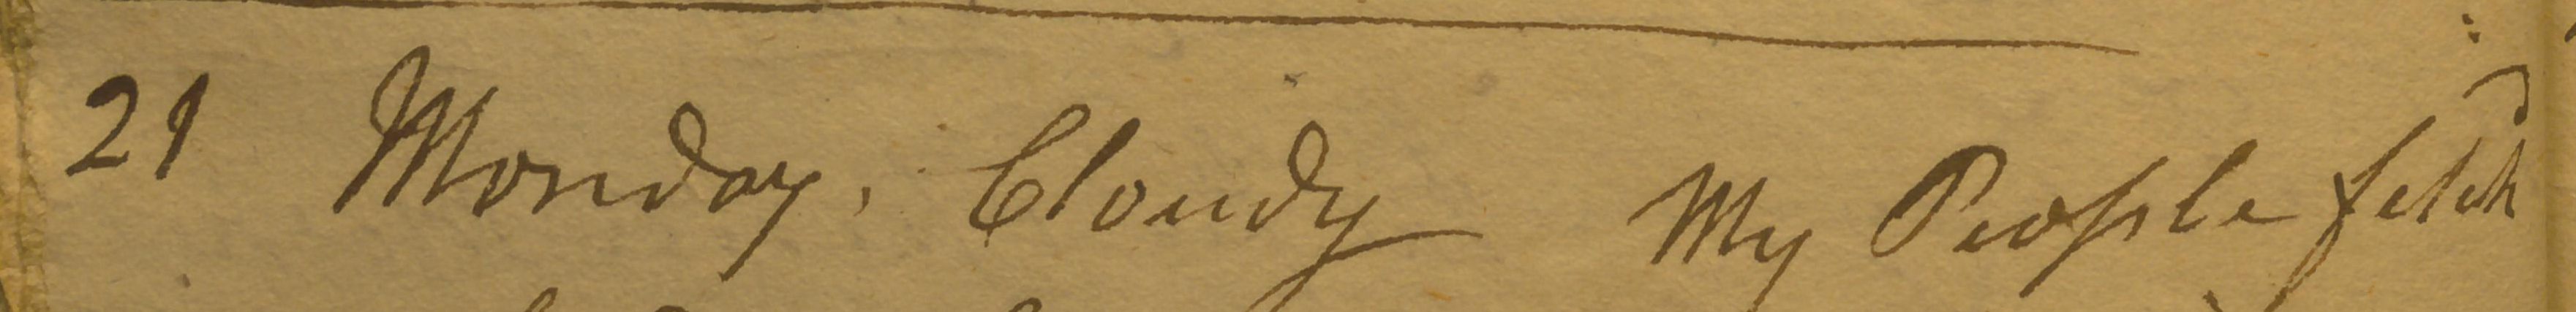21 Monday Cloudy My People fetch^d
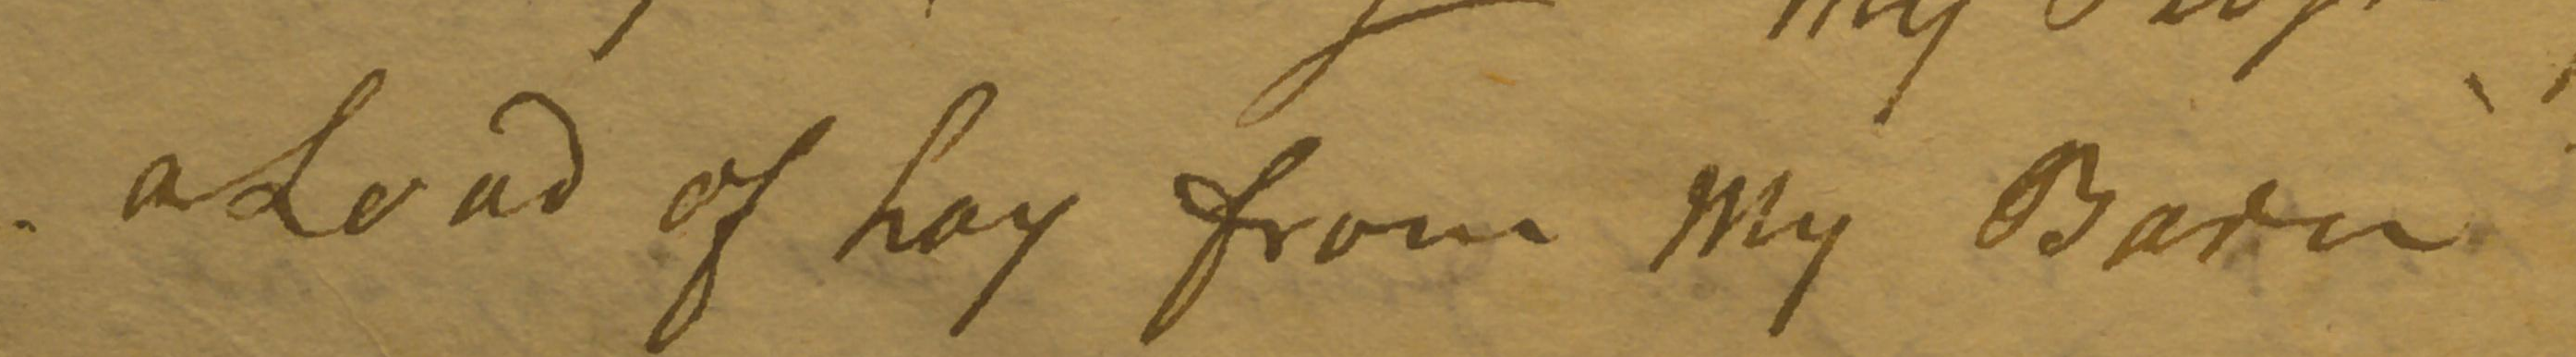a Load of hay from My Barn
